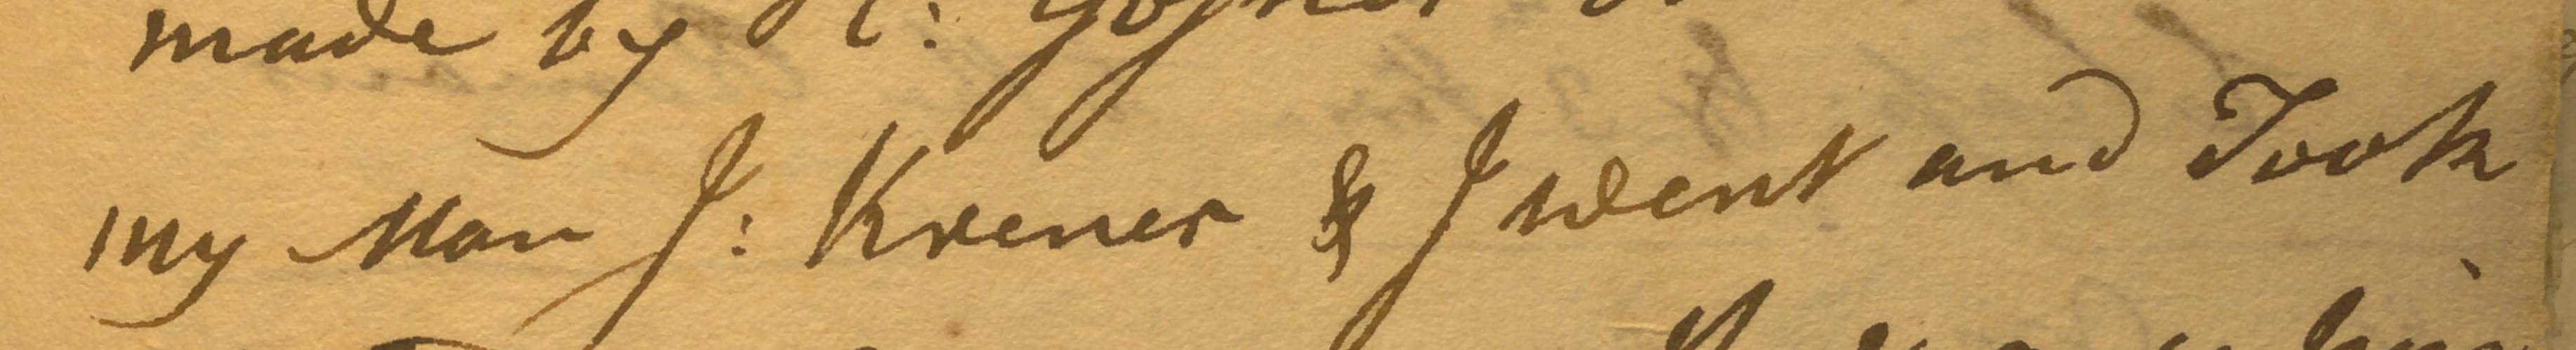My Man J: Krener & I went and Took
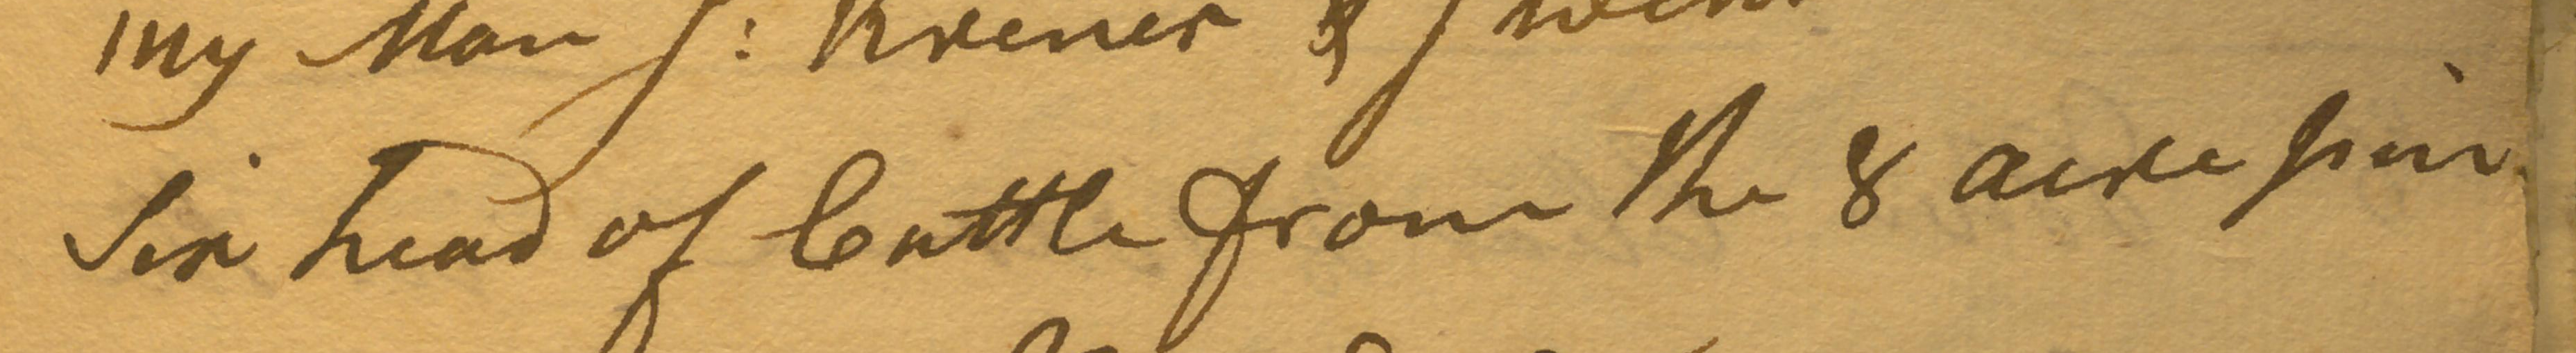six head of Cattle from the 8 acre pice
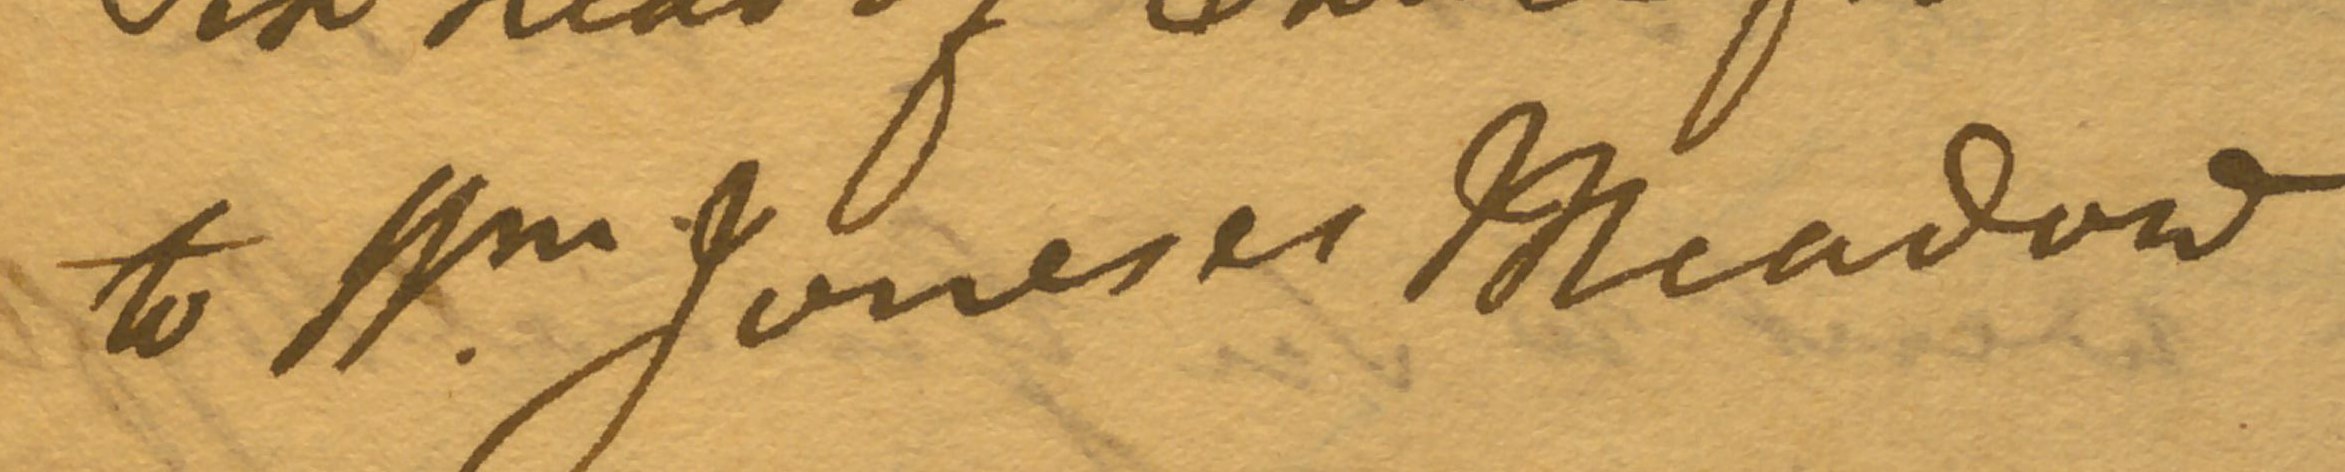to W^m. Joneses Meadow
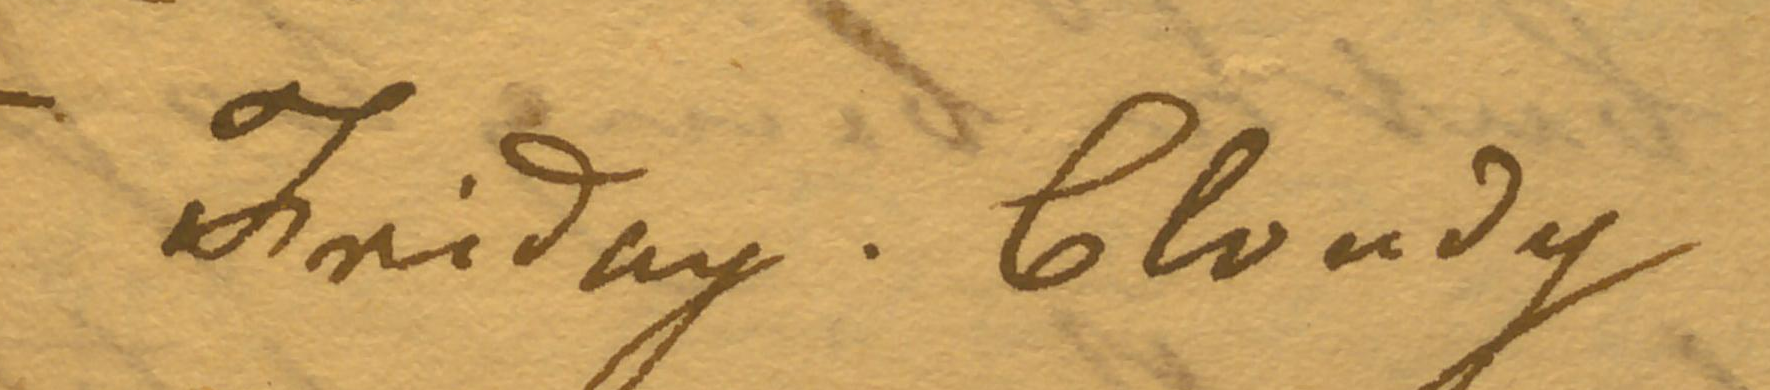Friday. Cloudy
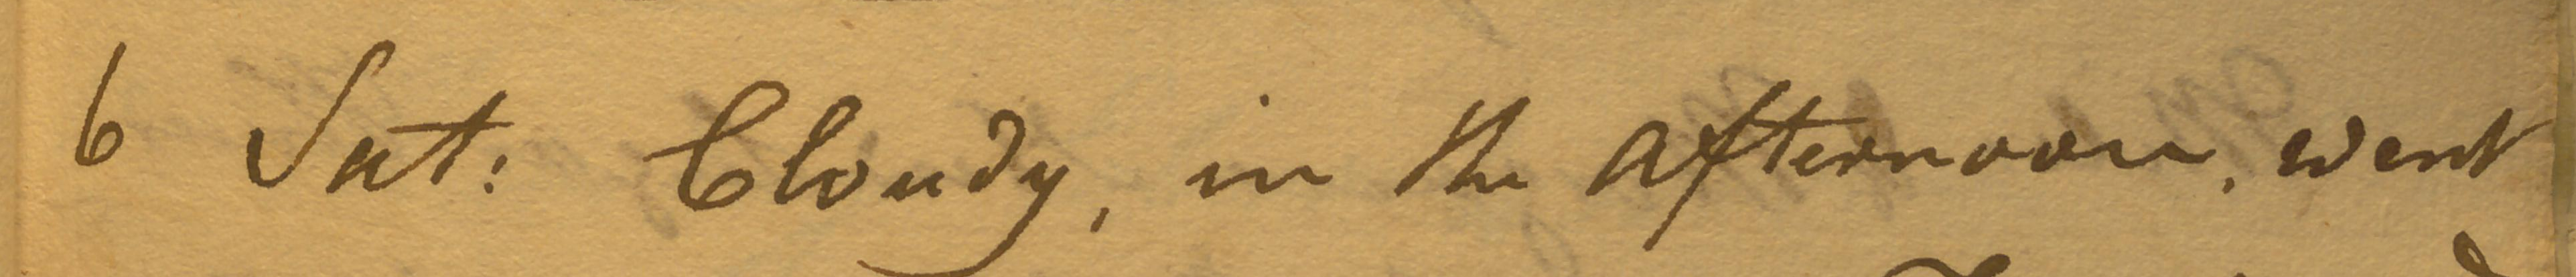6 Sat. Cloudy, in the afternoon went
